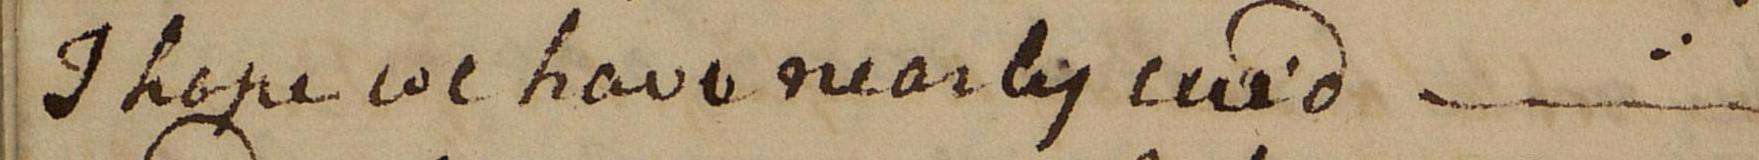I hope we have nearly cur'd--
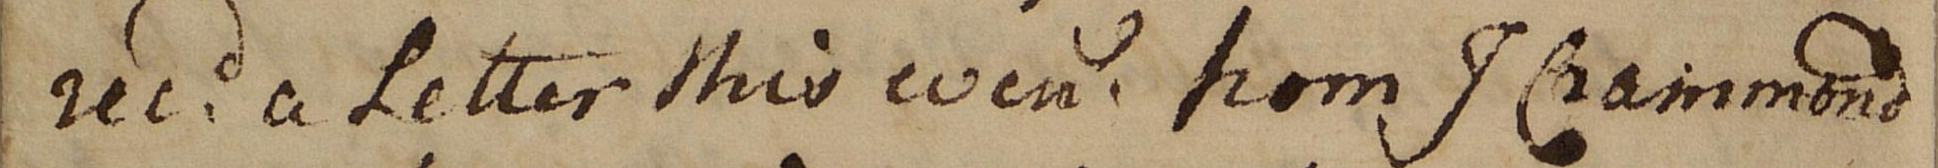rec^d. a Letter this even^g from J Crammond
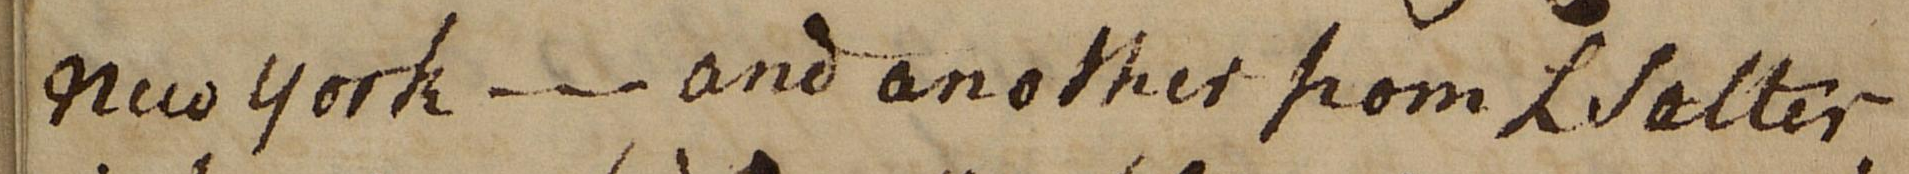New York- and another from L Salter,
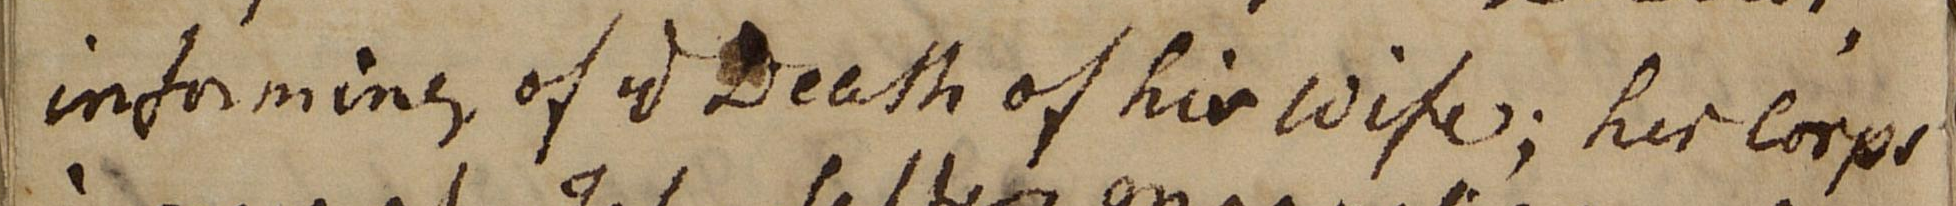informing of y^e Death of his wife; her corps
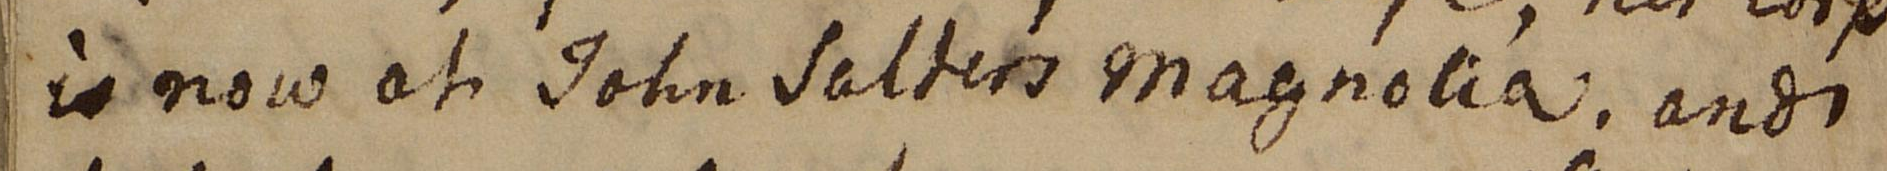is now at John Salters Magnolia, and
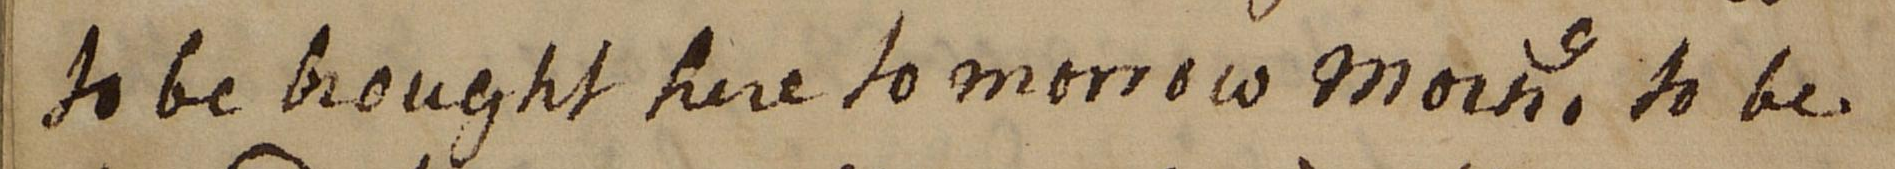to be brought here to morrow morn^g. to be
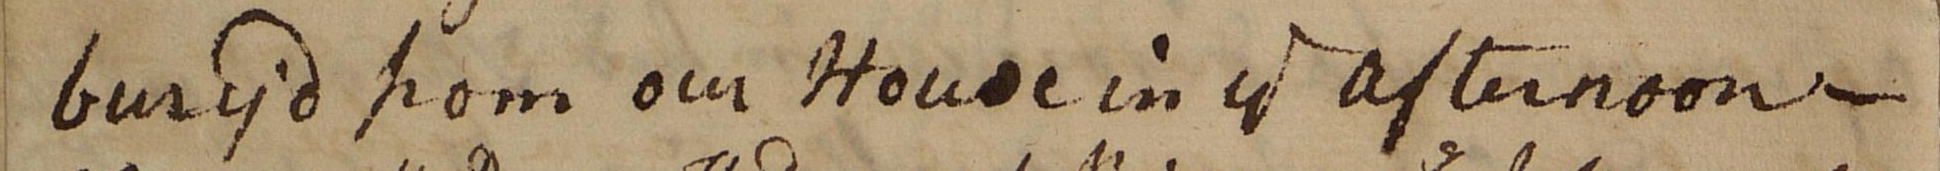bury'd from our House in y^e afternoon-
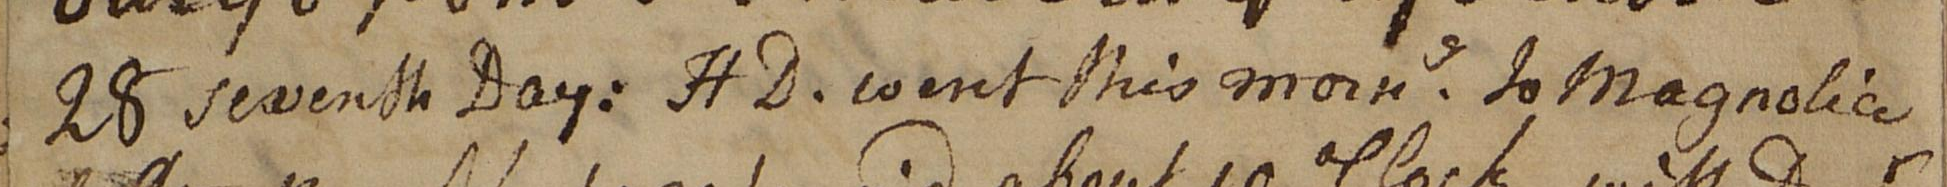28 seventh Day: H D: went this morn^g. To Magnolica
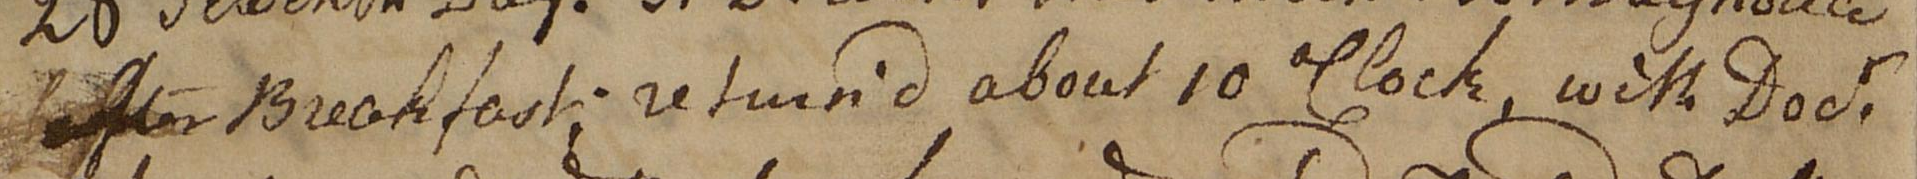after Breakfast; return'd about 10 ^o Clock, with Doc^r,
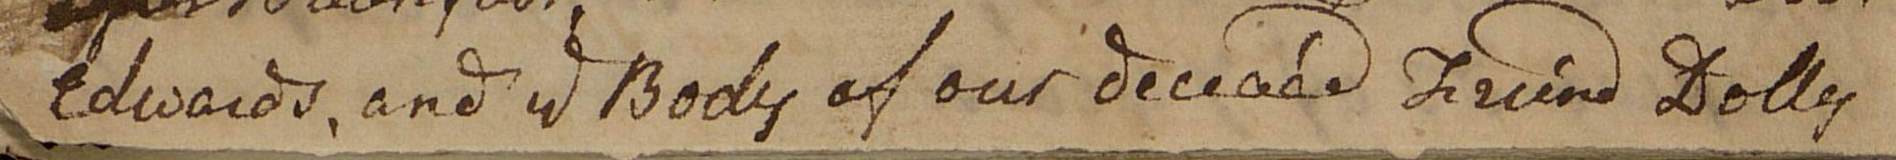Edwards, and y^e Body of our deceas'd Friend Dolly
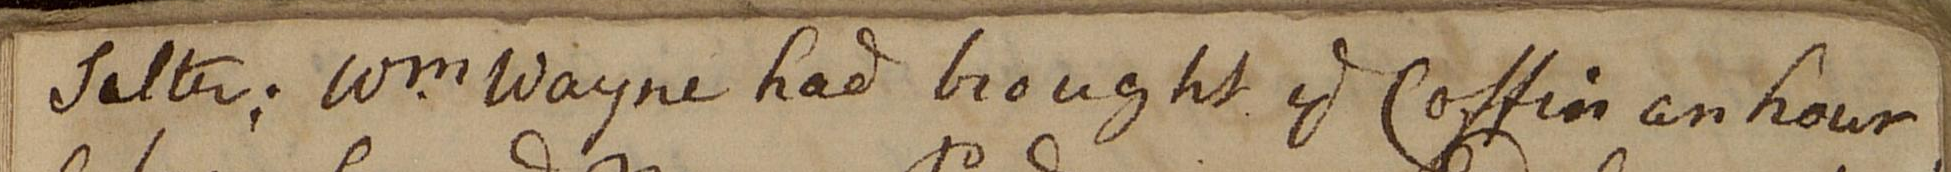Salter; W^m. Wayne had brought y^e Coffin an hour
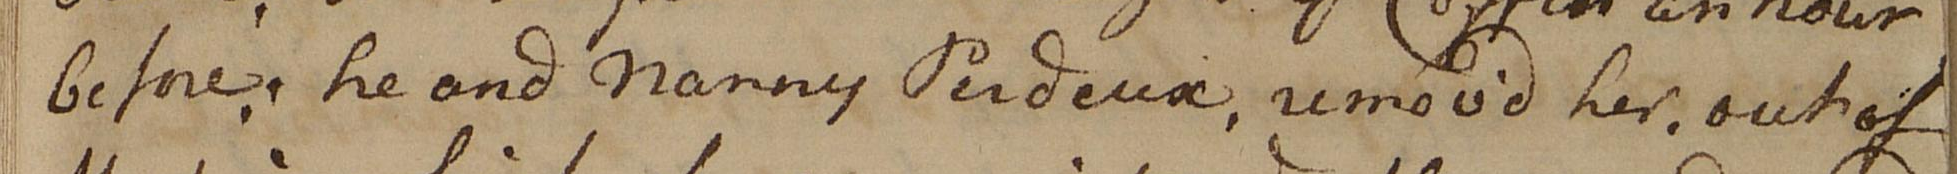before, he and Nanny Perdeux, remov'd her, out of
